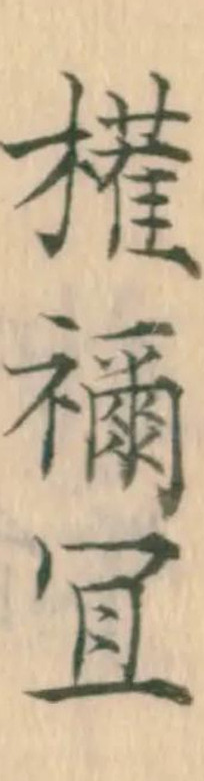権祢宜
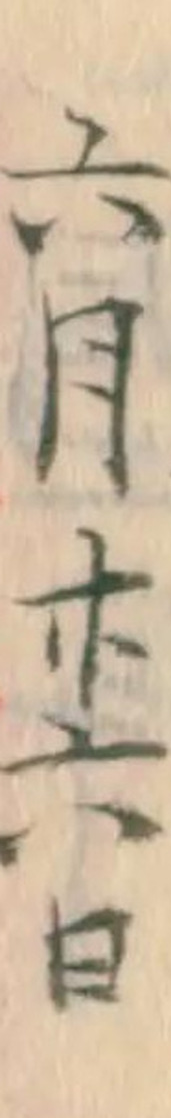六月廿二日
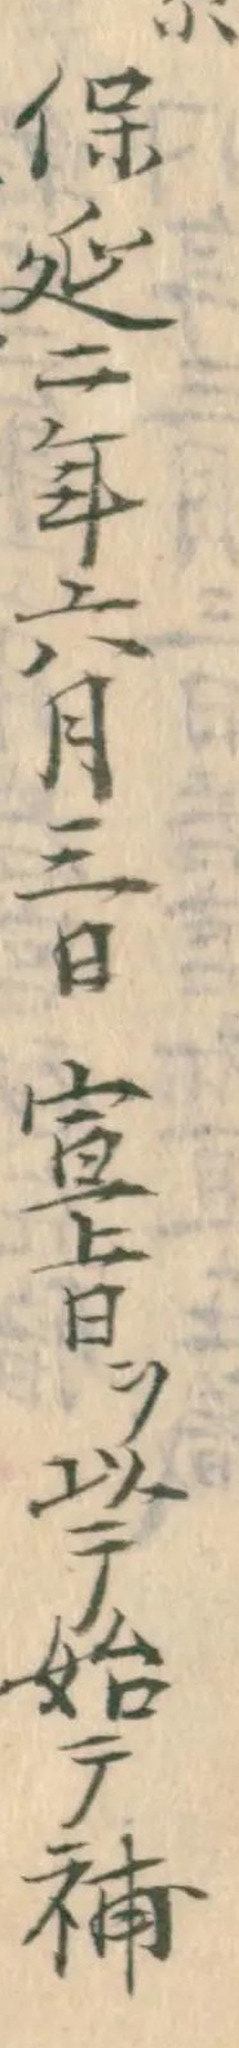助平保延二年六月三日宣旨ヲ以テ始テ補
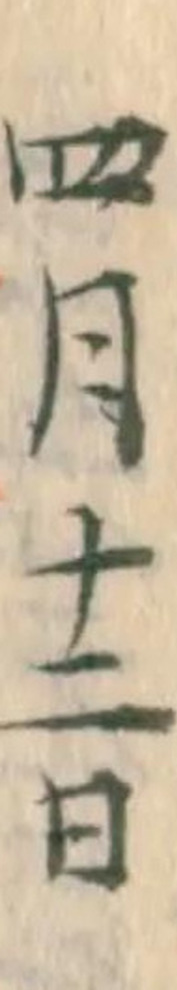六月廿二日
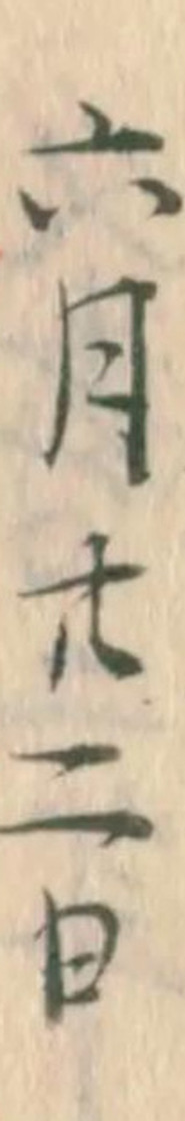六月廿二日
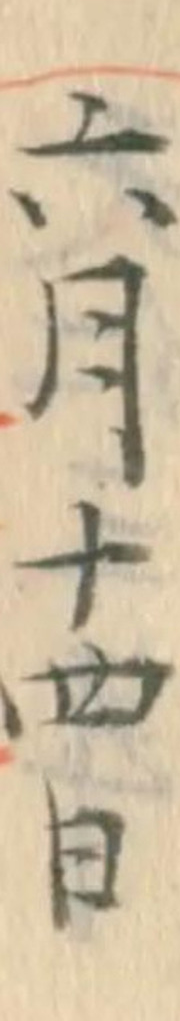六月廿二日

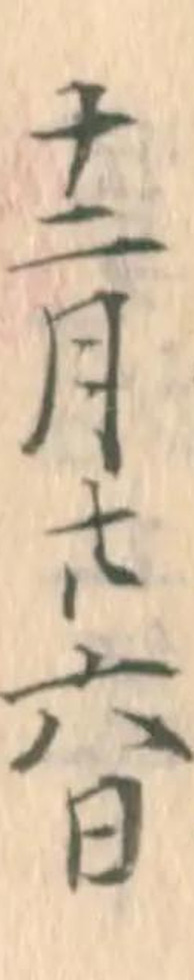十二月廿六日
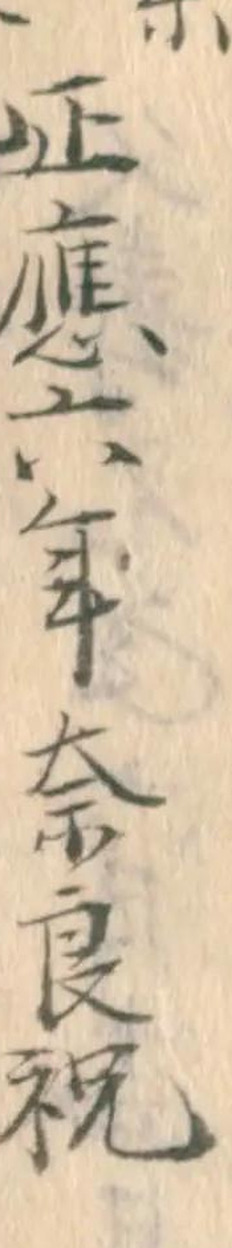正応六年奈良祝
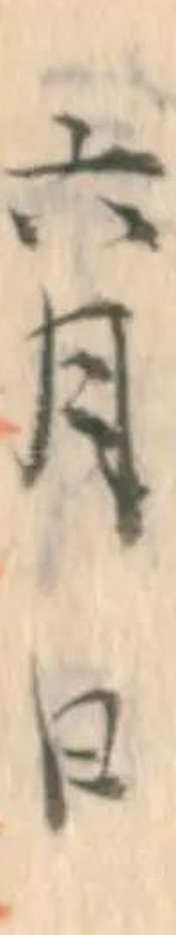六月日
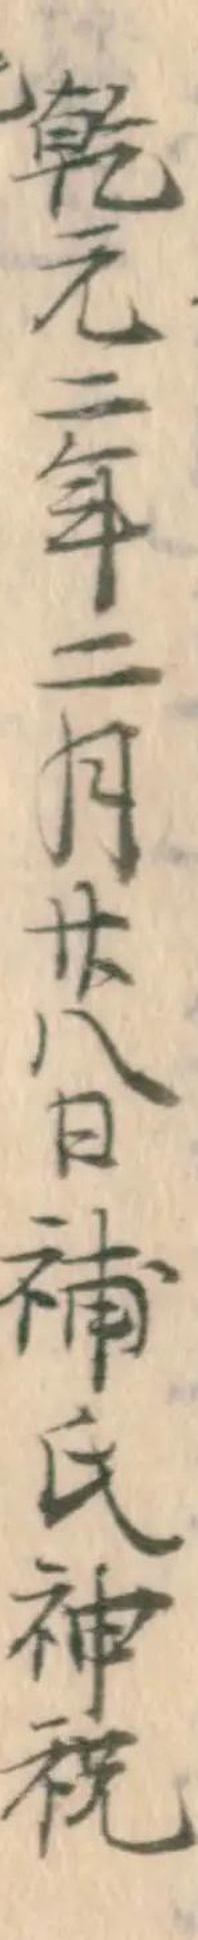乾元二年二月廿八日補氏神祝
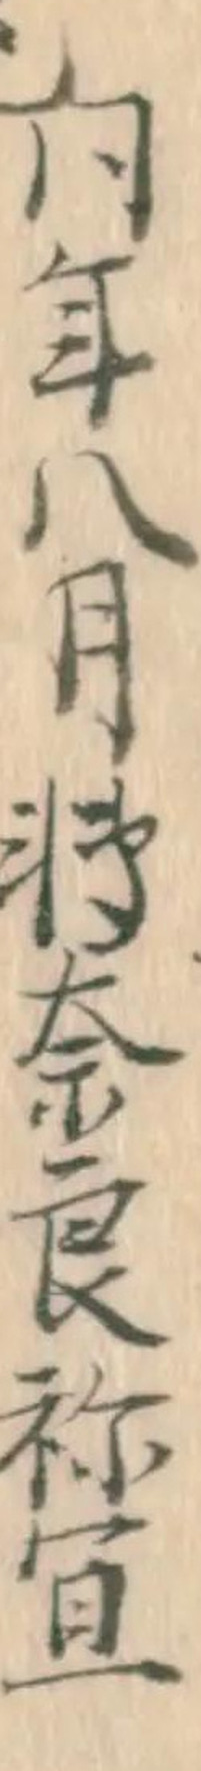同年八月転奈良祢宜
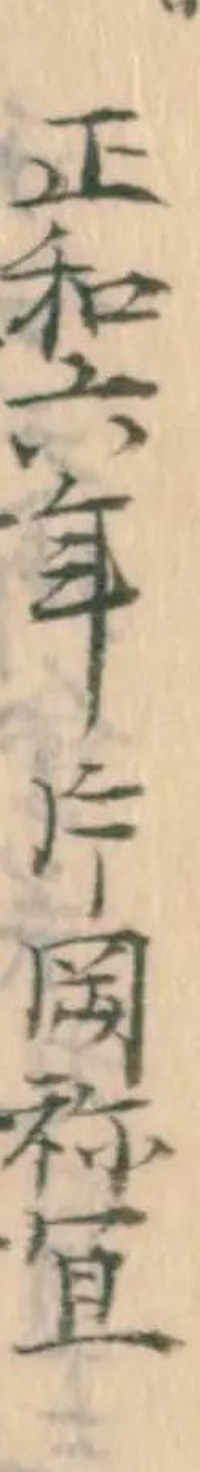正和六年片岡祢宜
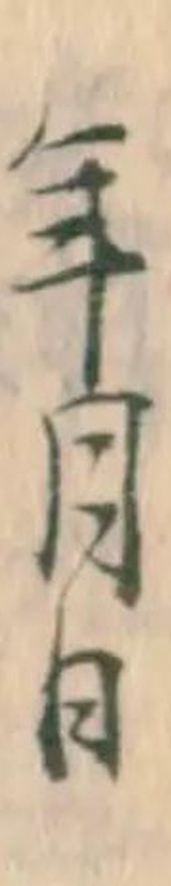六月日
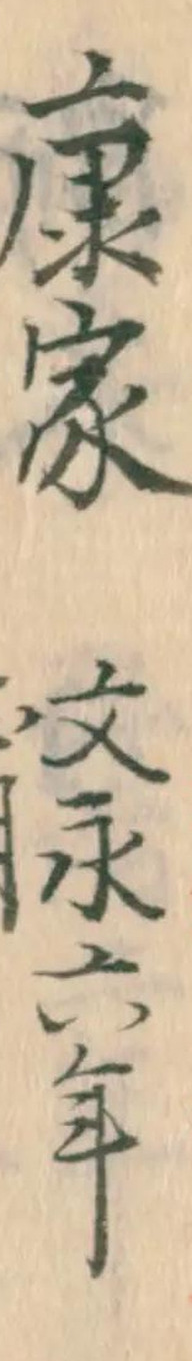康家文永六年
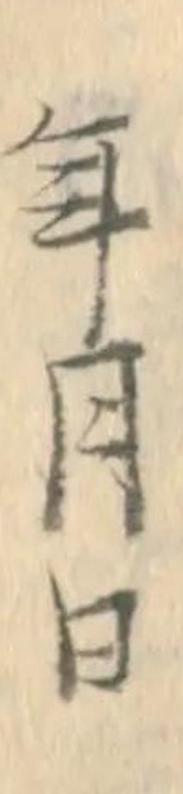六月日
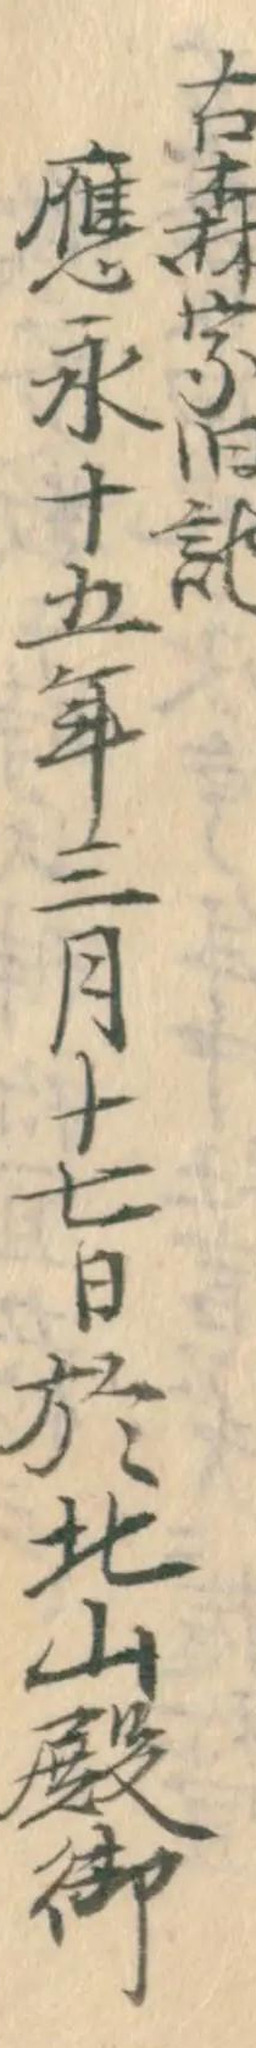仲久応永十五年三月十七日於北山殿御
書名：賀茂社記録. 第23冊
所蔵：国立国会図書館 National Diet Library, JAPAN
